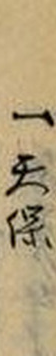一天保
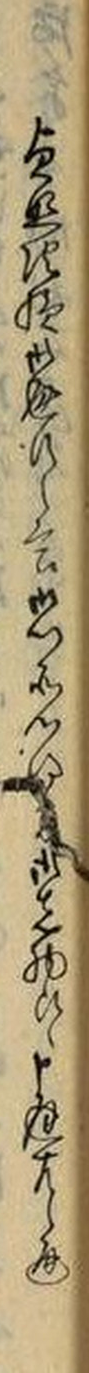貞照院様御通候之節御門所心得方御先物頭へ申通左之通
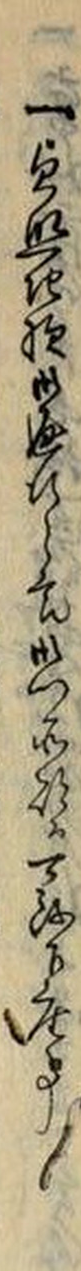一貞照院様御通行之節御門所都而可致下座候事
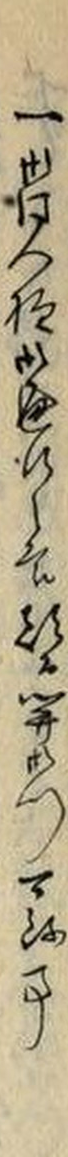一御同人様御通候之節都而開御門可致事
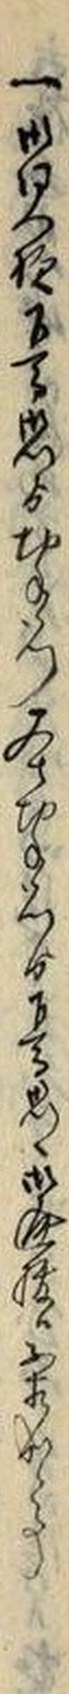一御同人様下馬御門ゟ切手御門又は切手御門ゟ下馬御門へ御通抜は不相成候事
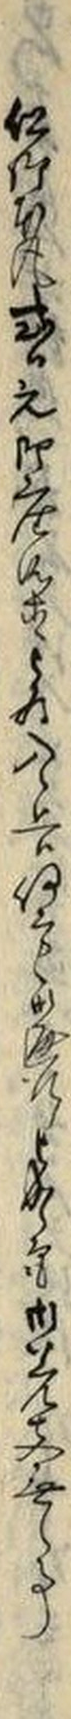但御本丸或は元御座所等へ被為入候上は何方へ御通行被成候而も御差支無之候事
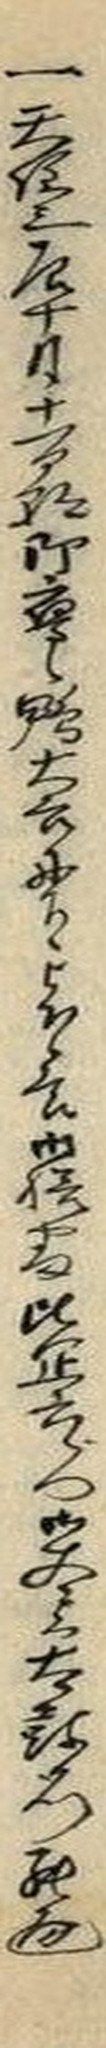一天保三辰十月十一日朝御鷹之鴨大谷丹下へ被下候節御膳番比企六郎右衛門御使に而太鼓御門罷通
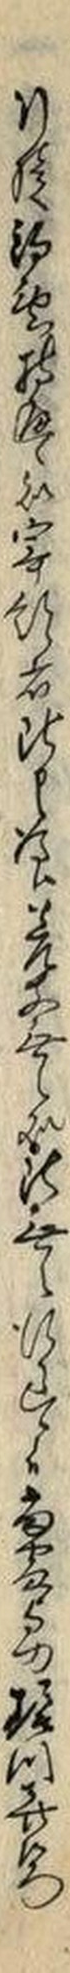引続釣台持通候処宰領之者断申候得は差支無之候処断無之行過候に付当番与力梶川喜左衛門
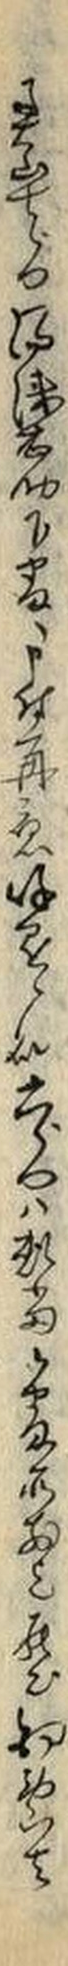奥山十郎右衛門湯浅甚助下番へ申付再応呼懸候処六郎右衛門は頰当御番所前迄罷出釣台者
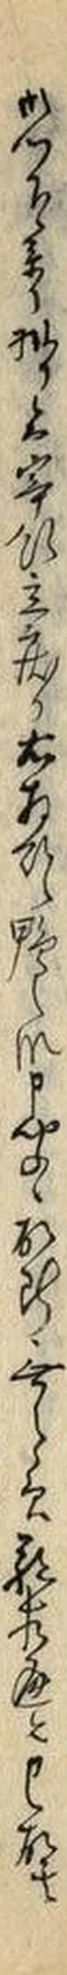御門下へ参り掛り候而宰領立戻り右拝領之鴨之段申聞候故断無之候而は難相通と申候故其
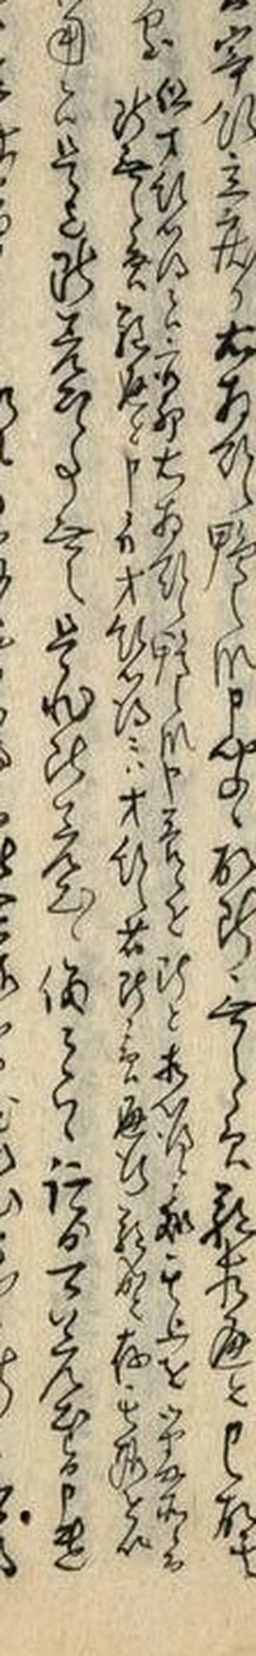断無之候而は難通と申に付才領心得には才領之者断候而は通行難成と存其趣を以
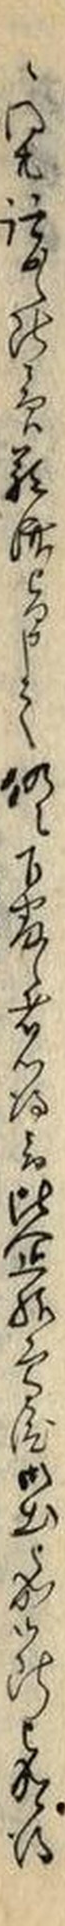候得共跡ゟ之断に而は難済旨申之仍之下番之者心得に而比企様鳥渡御出被成御断被成候得
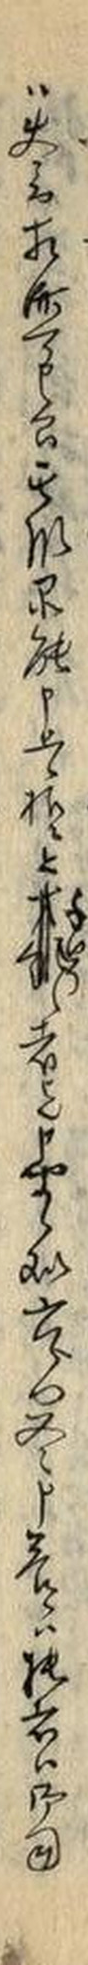は夫に而相済可申候間其段品能申上候様にと手廻りの者迄申聞候処六郎右衛門又々申答候は拙者は御用
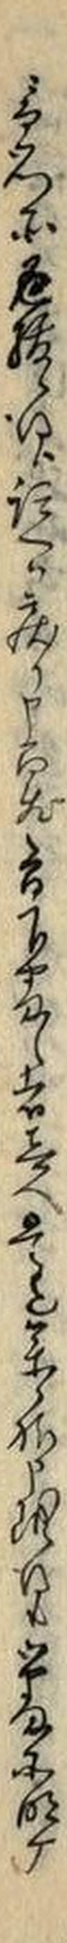に而御門所通抜候得は跡へは戻り申間敷候間下番之者壱人是迄参候様申越候得共御番所明ヶ
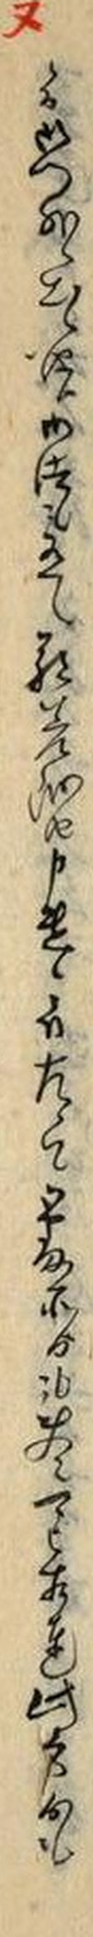に而御門外へ出候儀は御法も有之難差越由申遣候に付左候はゝ御番所ゟも夫々可被相達此方ゟも

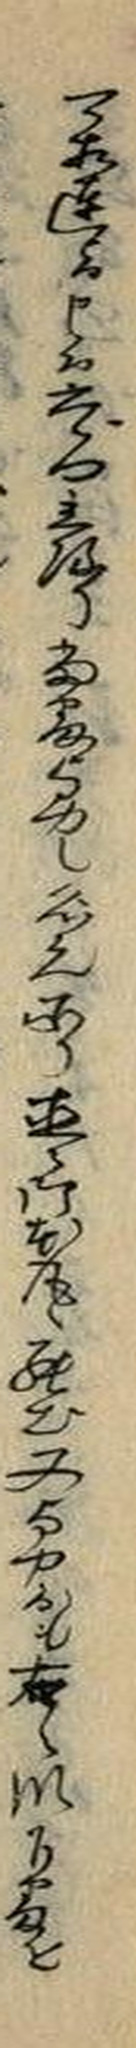可相達候旨申候而六郎右衛門立帰り当番与力名元承り直々御本丸へ罷出又与力方も右之段下番を
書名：御門御櫓之部
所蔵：福井県文書館 Fukui Prefectural Archives
